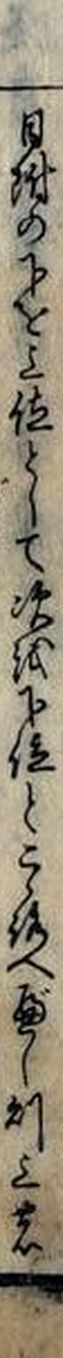日附の下を上位として次を下位とこゝろへべし則上の
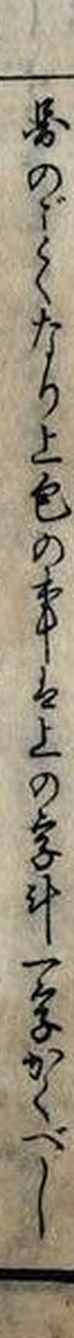圖のごとくなり上包の事は上の字斗一字かくべし
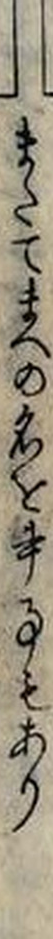またてまへの名を書事もあり
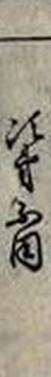次第不同
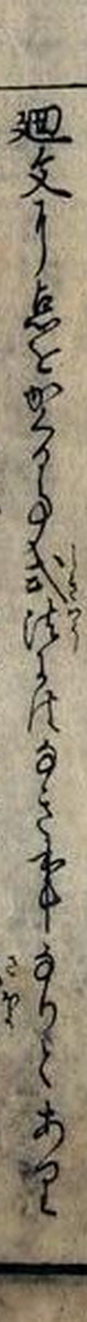廻文に点をかくる事式法にはなき事なりとあり
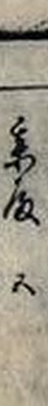某殿五
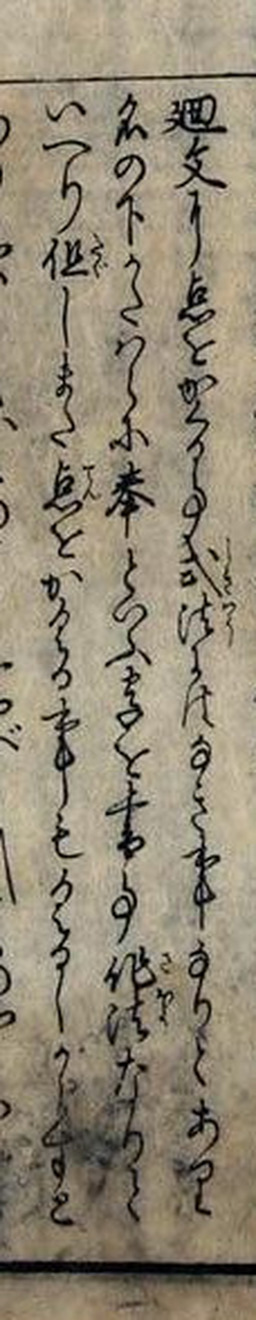名の下かたはらに奉といふ字を書事作法なりと
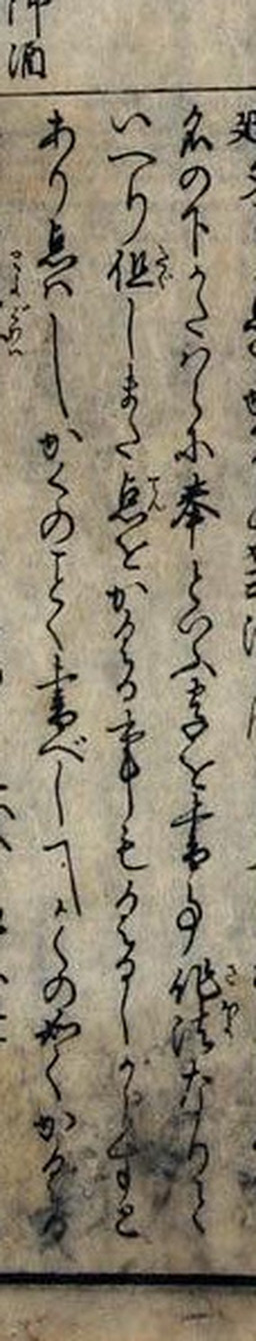いへり但しまた点をかくる事もくるしからずと
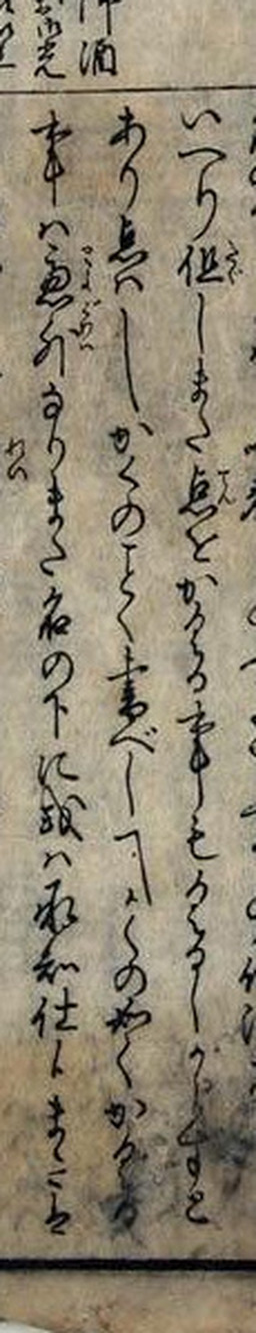あり点はかくのことく書べしかくの如くかくる
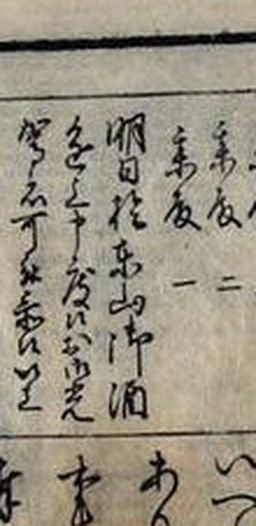明日於東山御酒
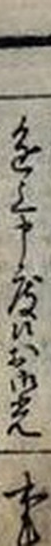進上申度候猶御光
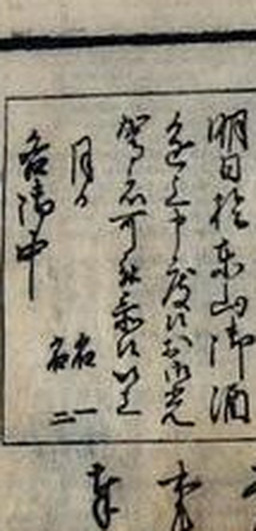駕者可被忝候以上
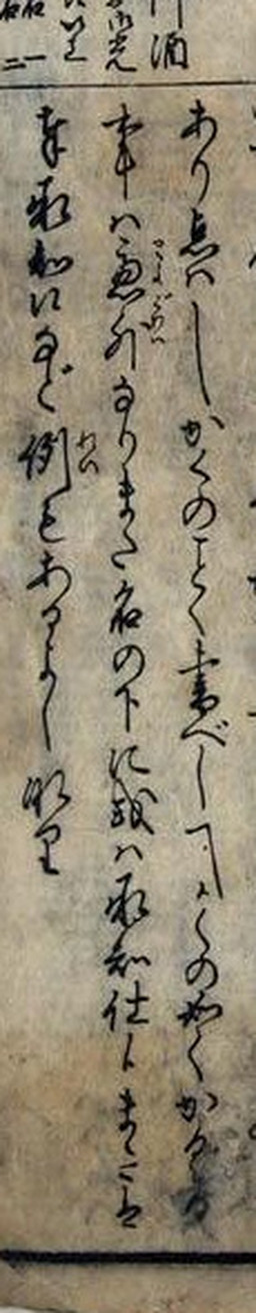事は慮外なりまた名の下に或は承知仕候または
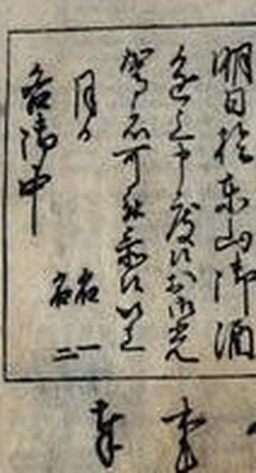駕者可被忝候以上
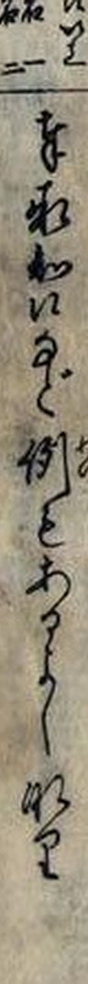奉承知候など例もあるよしなり

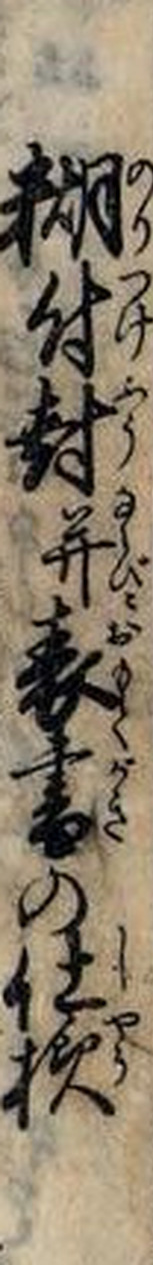糊付封并表書の仕様
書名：大成用文章（往来物）
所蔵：福井県文書館 Fukui Prefectural Archives
